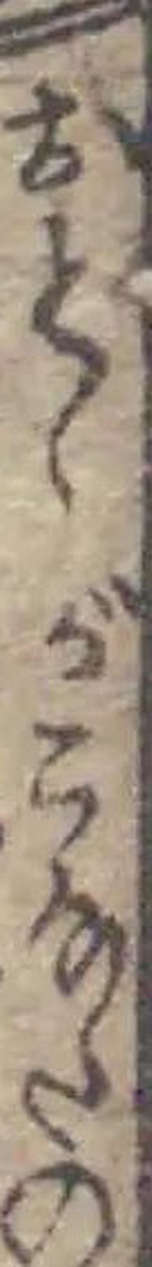おとゝがこなたの
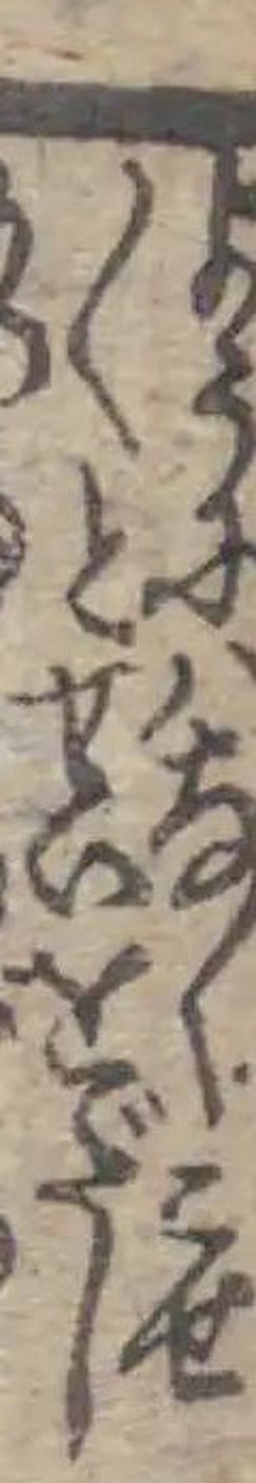〳〵とせいをだし
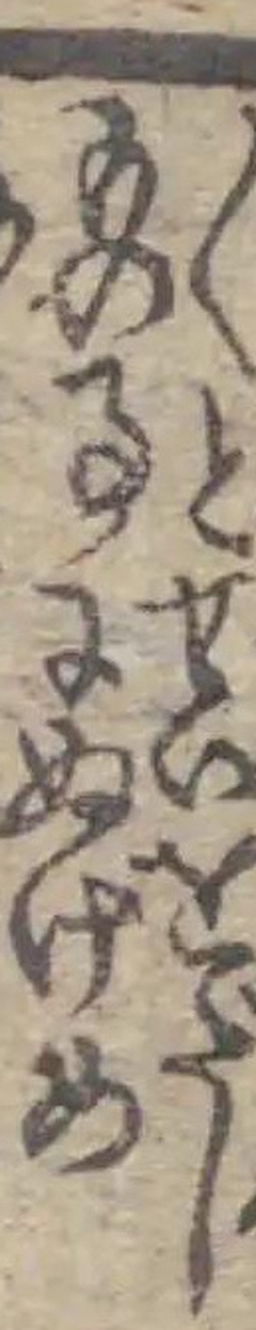もの事にぬけめ
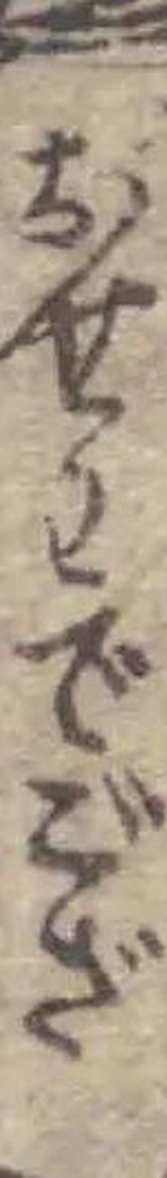おせわでござ
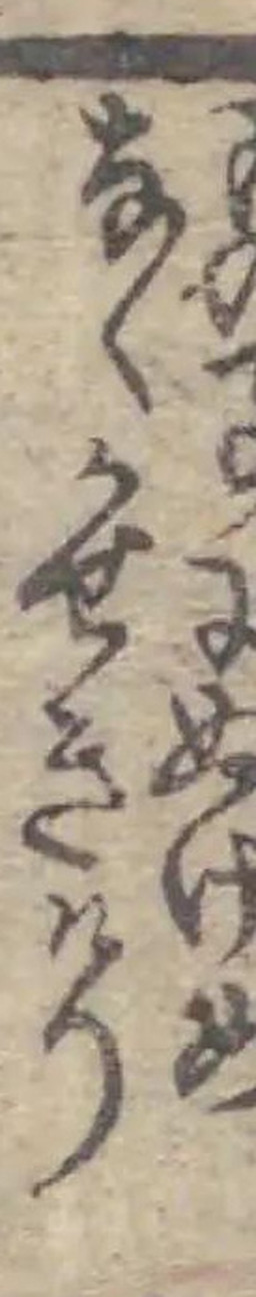なくかせきけり
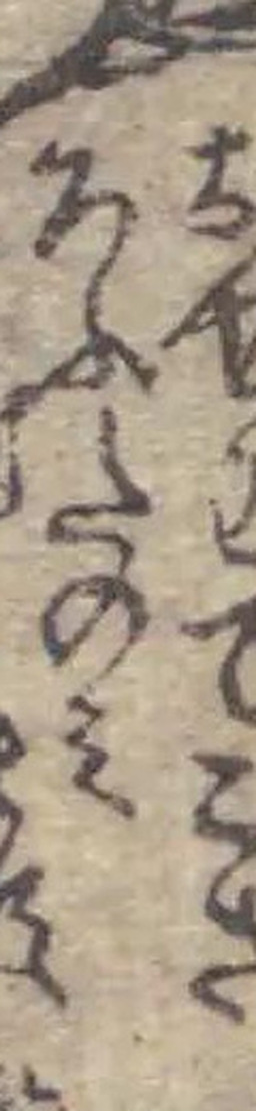ろふたのみ
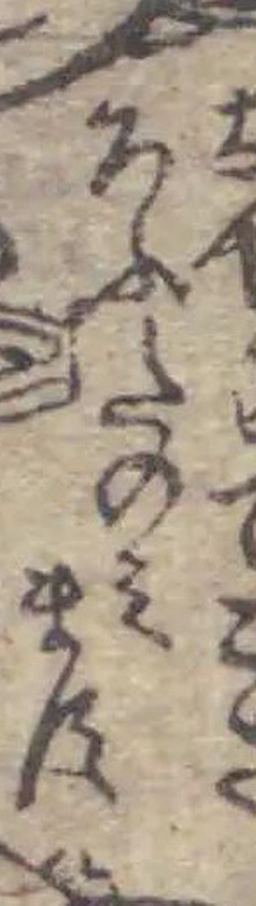ろふたのみ
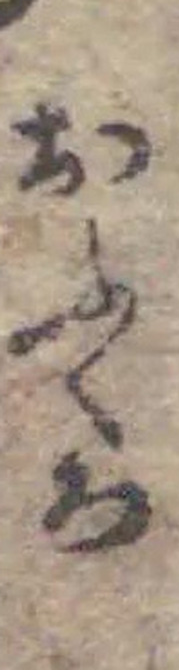おふくろ
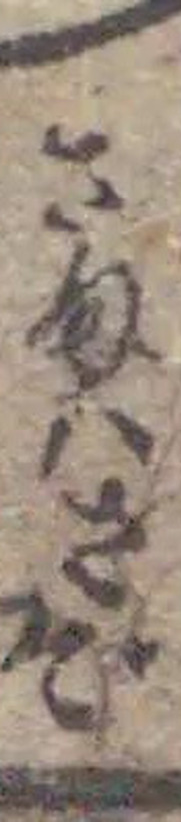さまはさぞ
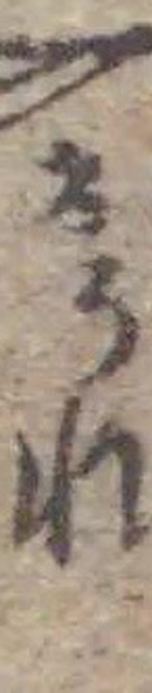おうれ
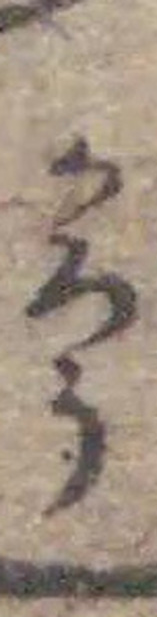かろう

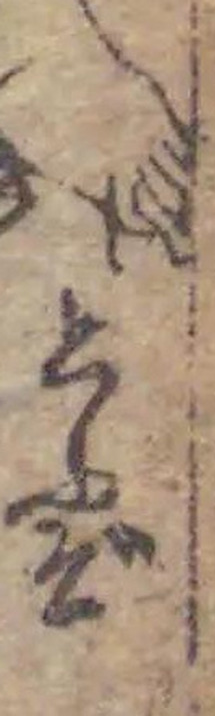とふぞ
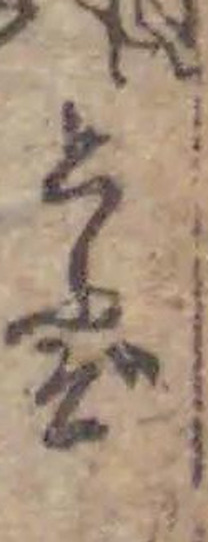とふぞ
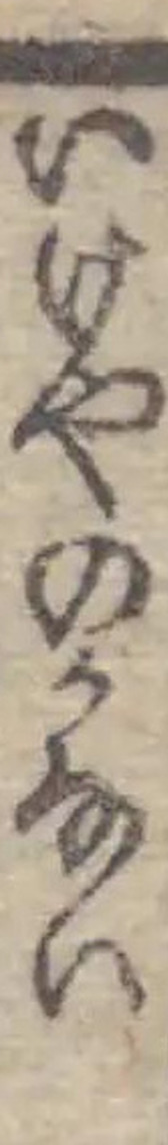いけやのかない
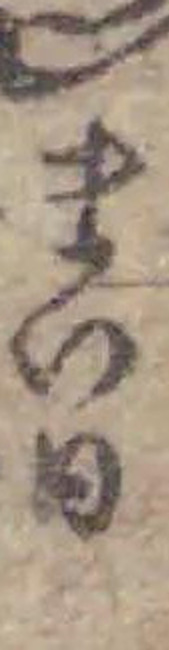まい日
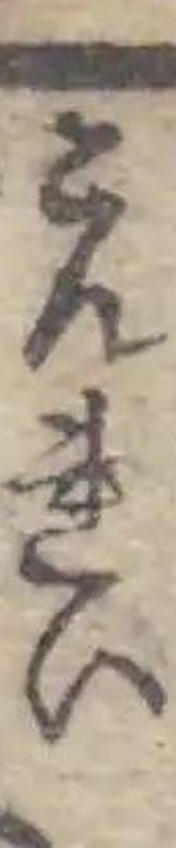こんれい
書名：津以曽無弟の甚六 3巻
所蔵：国立国会図書館 National Diet Library, JAPAN
